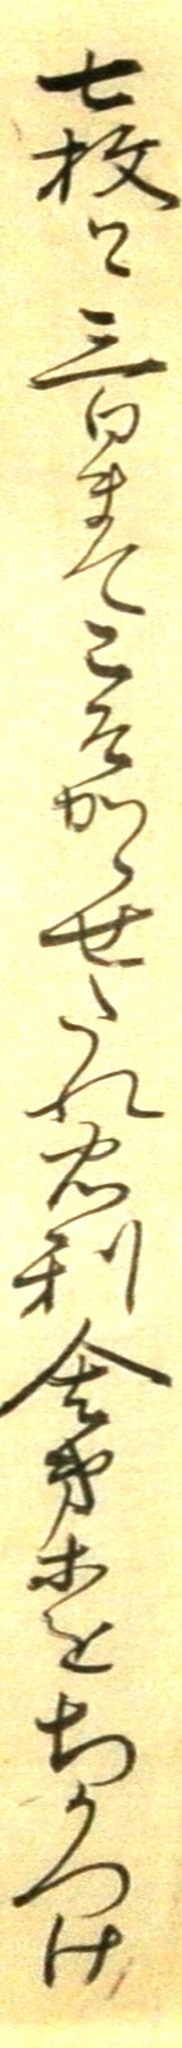七枚ツヽ三日まてこそかかせたれ忠利舎弟等をちかつけ
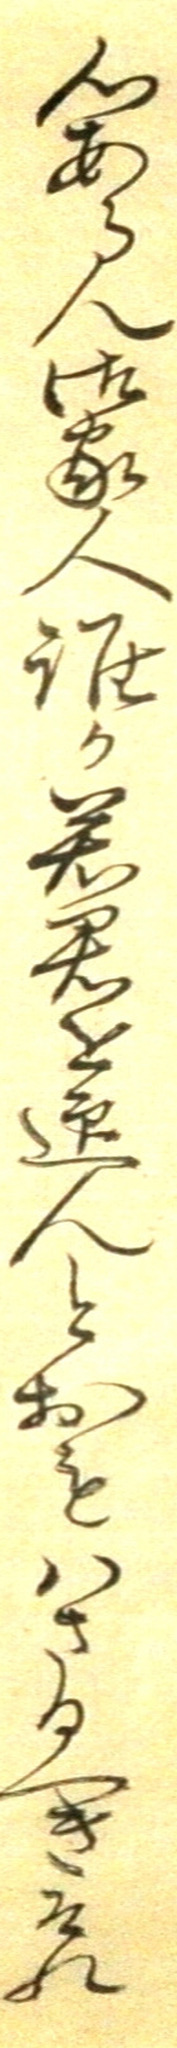心あらん御家人誰か若君を迎んとおもはさるへきそれ
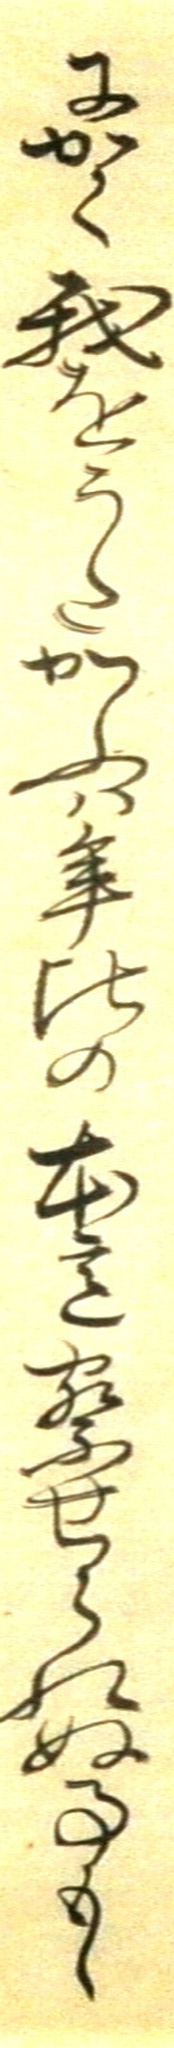にかく我をうたかふは年比の本意察せられぬ事もし
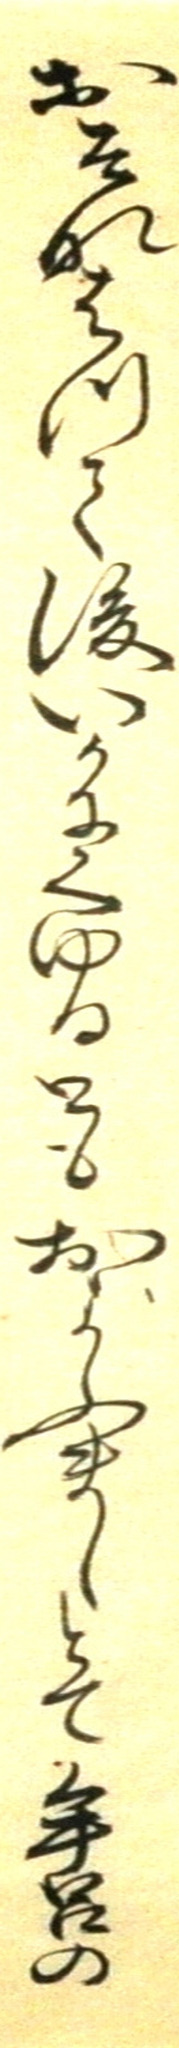おそなはつて後いかにくゆるともおよふましとて牟呂の
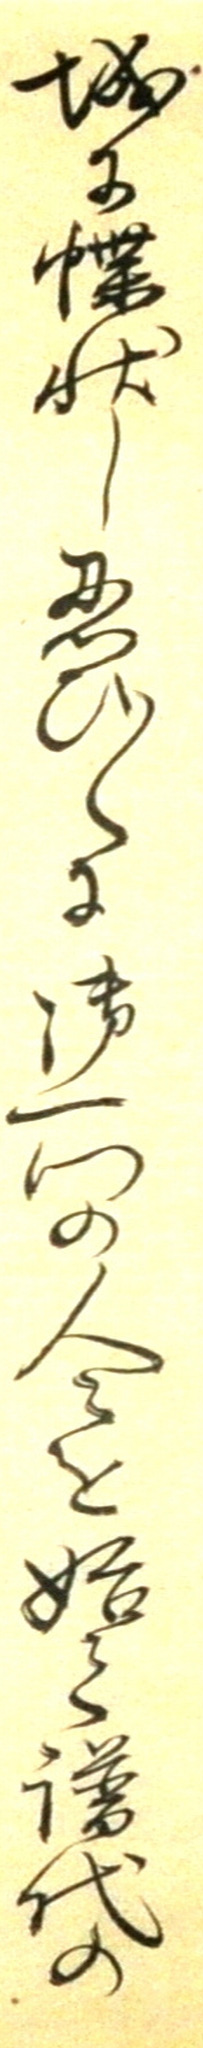城に諜状し忍ひ〳〵に御一門の人々を始て譜代の
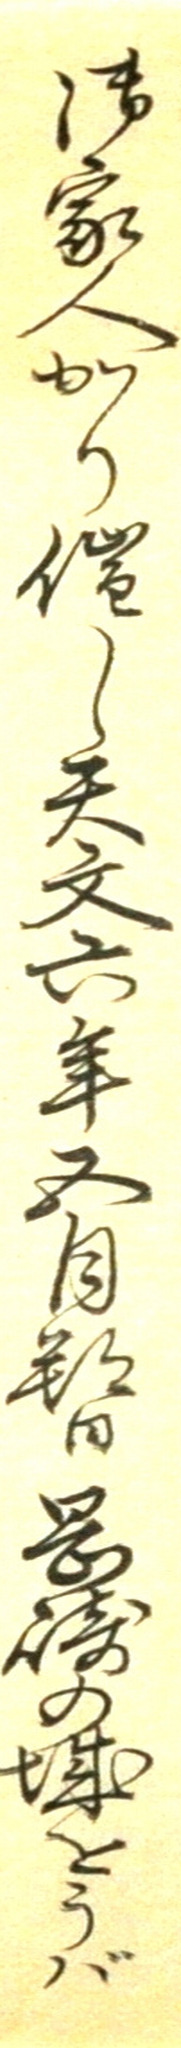御家人かり催し天文六年五月朔日岡崎の城をうば
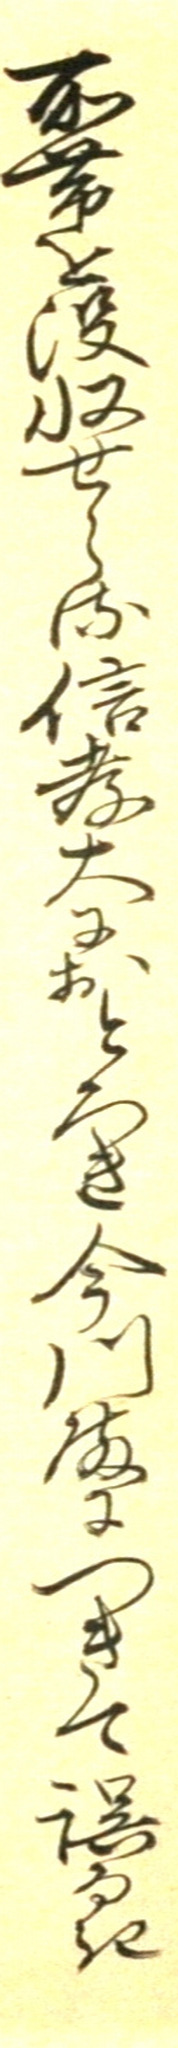所帯を没収せらる信孝大におとろき今川殿につきて誤なき
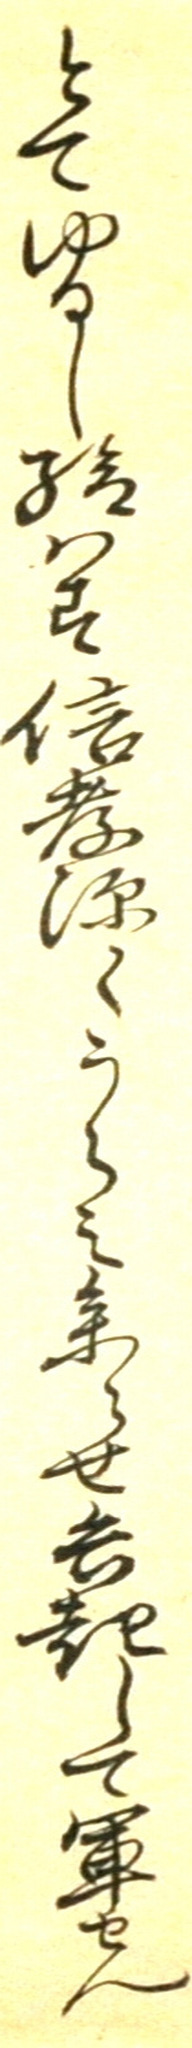とてゆるし給はす信孝深くうらみ参らせ兵起して軍せん
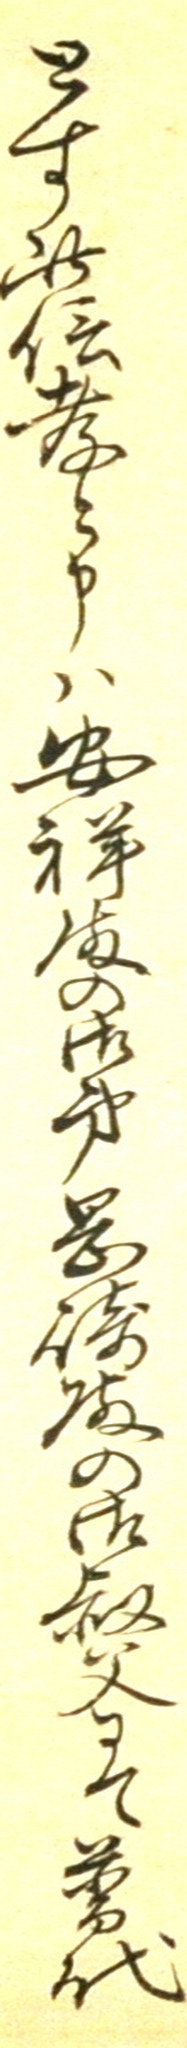とす此信孝と申は安祥殿の御弟岡崎殿の御叔父にて普代
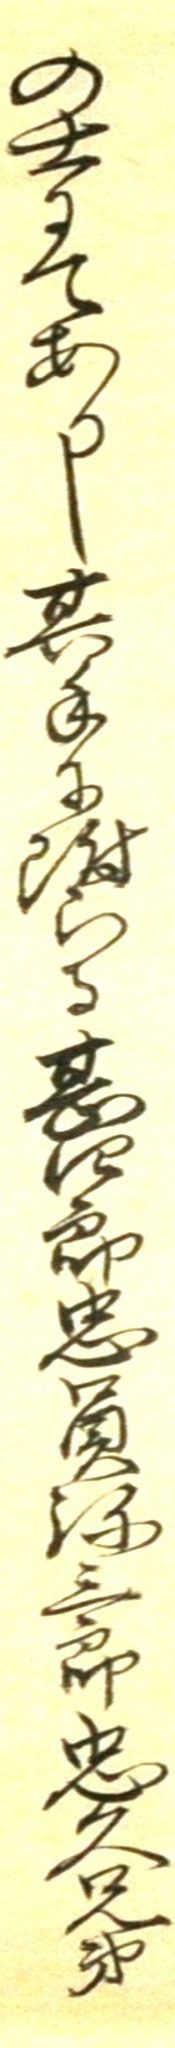の士にてありし其手に附らる甚四郎忠員弥三郎忠久兄弟
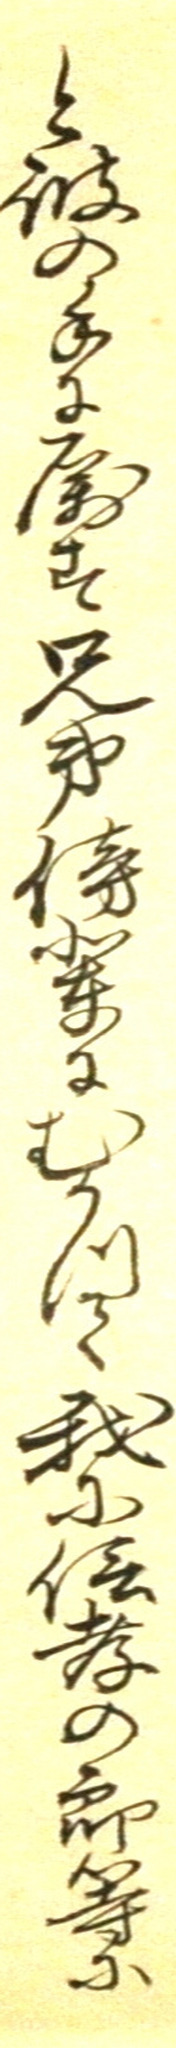と彼の手に属す兄弟傍輩にむかつて我に信孝の郎等に
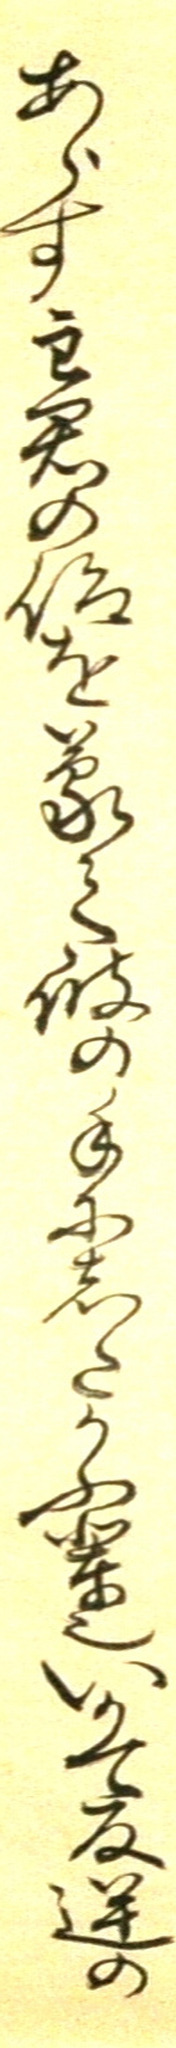あらす主君の仰を蒙て彼の手にしたかふ輩也いかて反逆の
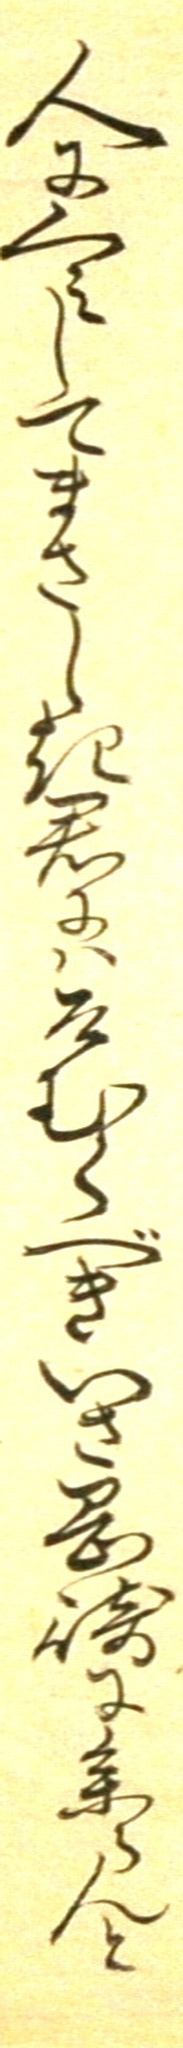人にくみしてまさしき君にはそむくべきいさ岡崎に参らんと
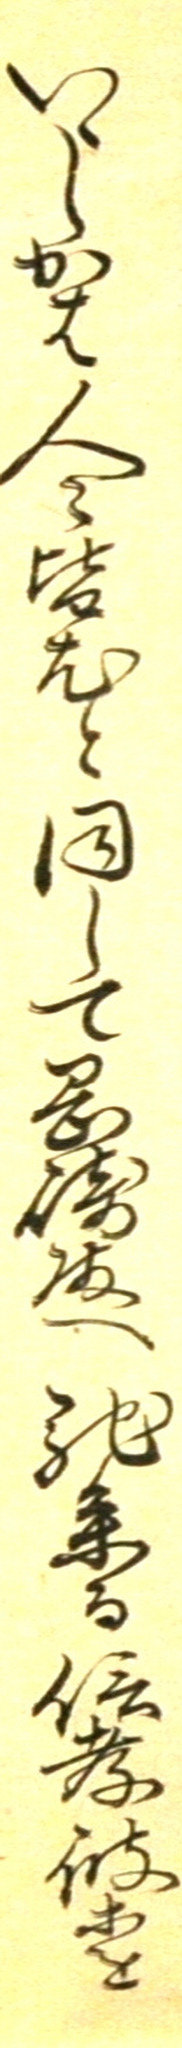いゝしかは人々皆尤と同して岡崎殿へ馳参る信孝彼等を
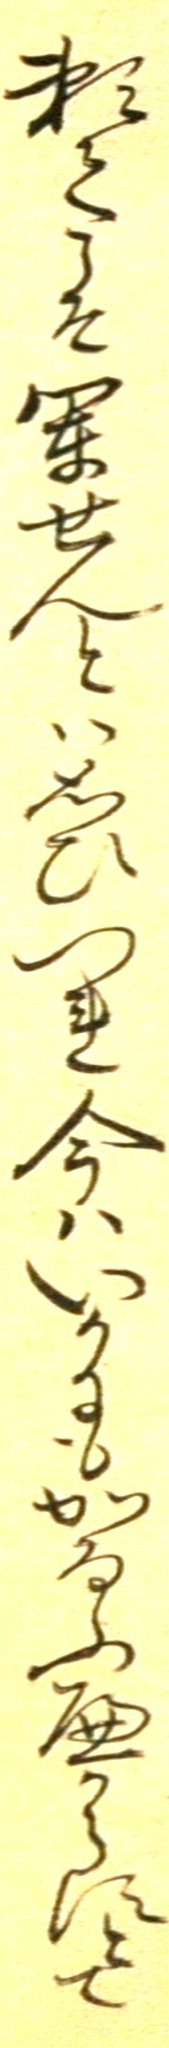頼てこそ軍せんとは思ひつれ今はいかにもかなふへからすとて

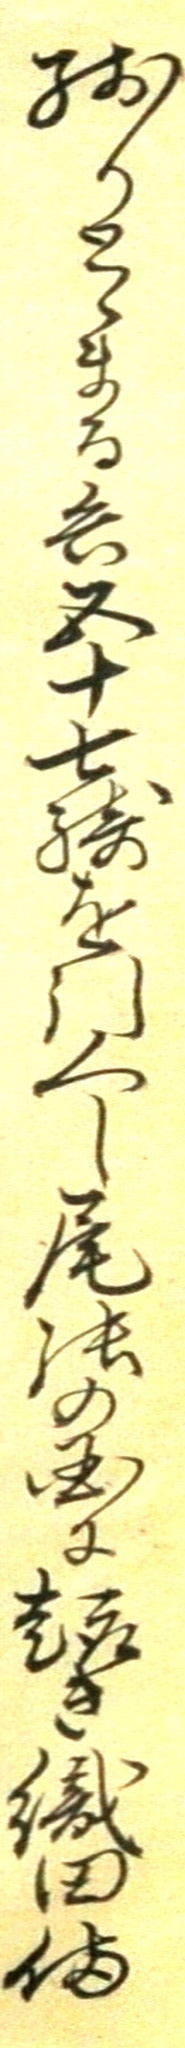残りとゝまる兵五十七騎を引へし尾張の国に趣き織田備
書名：藩翰譜（四・中）
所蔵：伊那市立高遠町図書館・合同会社AMANE
